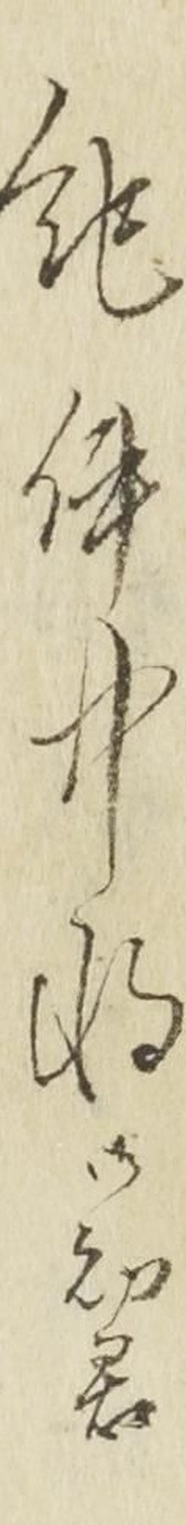紀伊中将御幼君
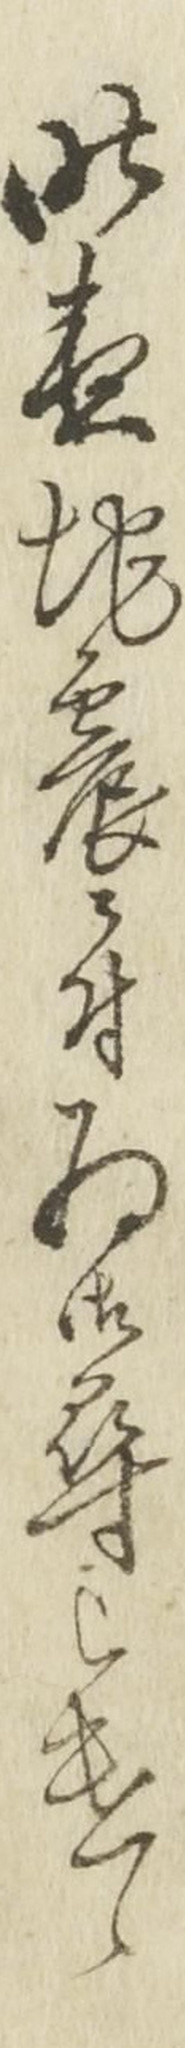昨夜地震二付為御尋被遣候
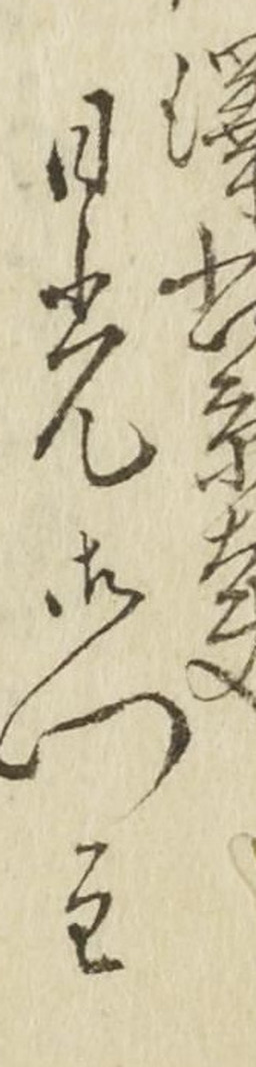日光御門主
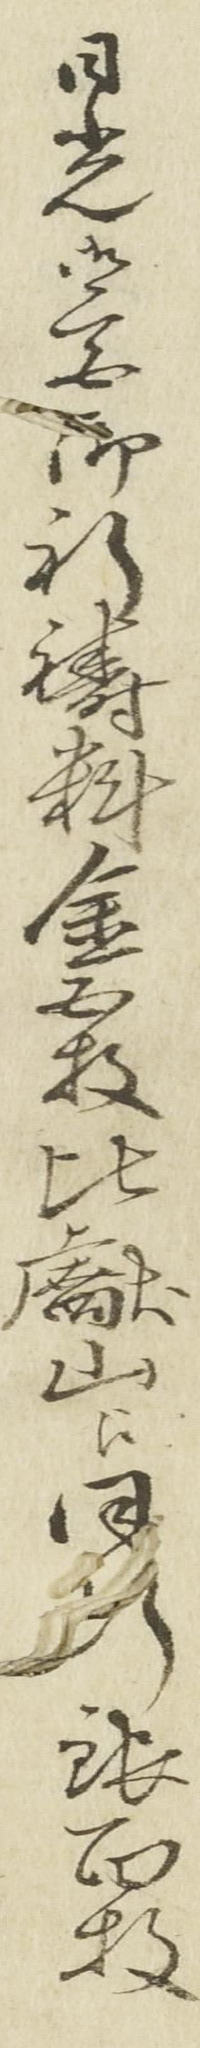日光御宮御祈祷料金五枚比叡山え同断銀百枚
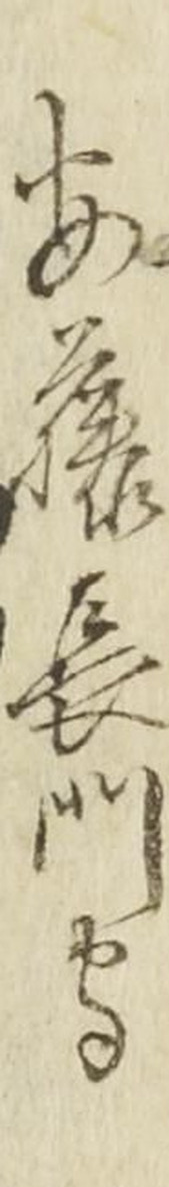安藤長門守
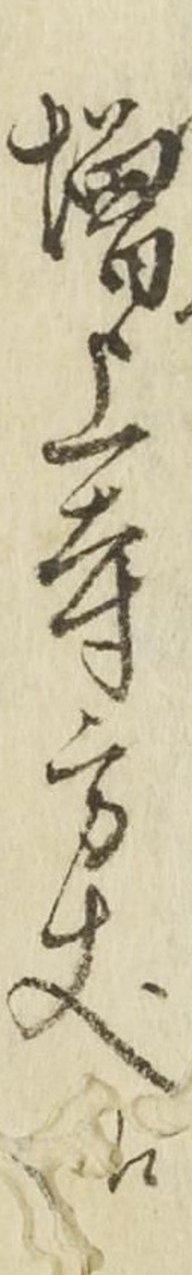増上寺方丈江
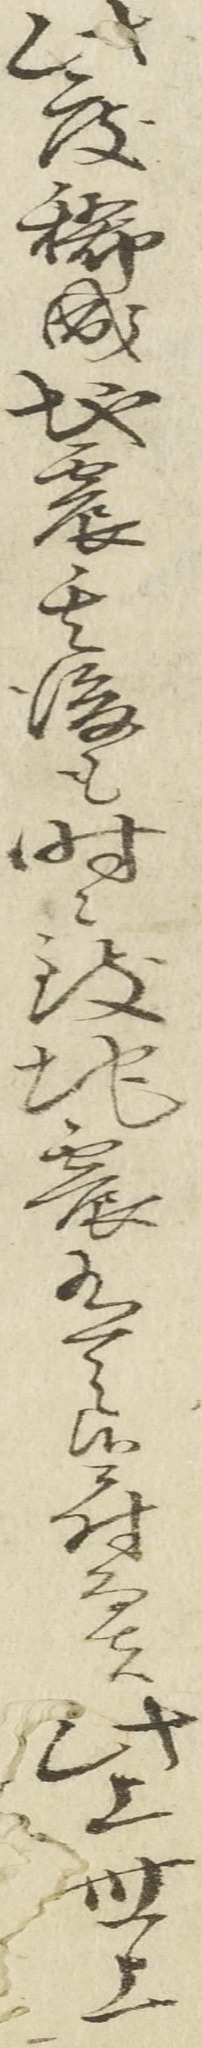此度稀成地震は其後も時々致地震有之候ニ付而者此上世上
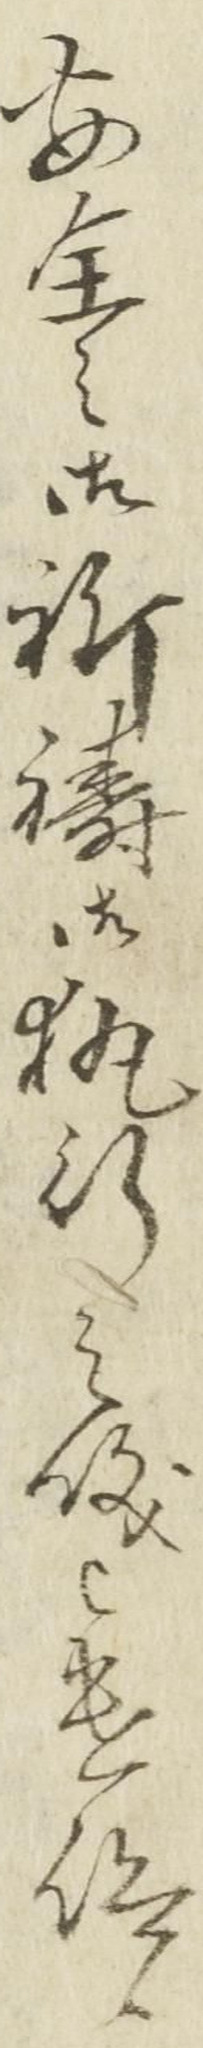安全之御祈祷御執行之儀被遣仰候
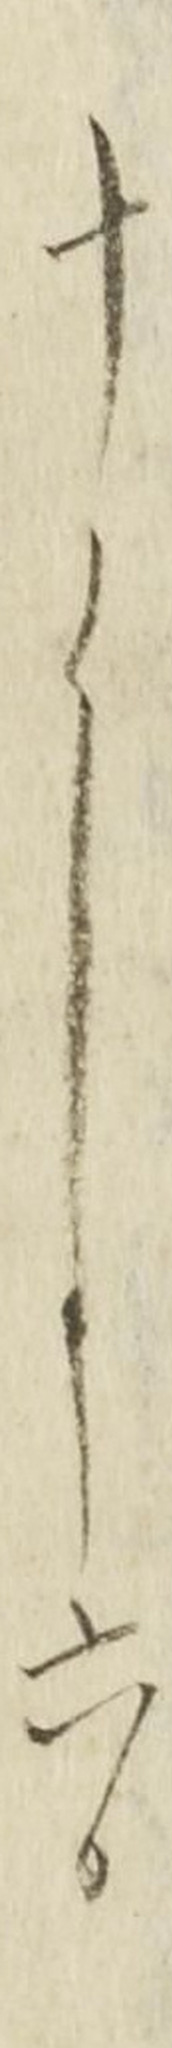十月六日
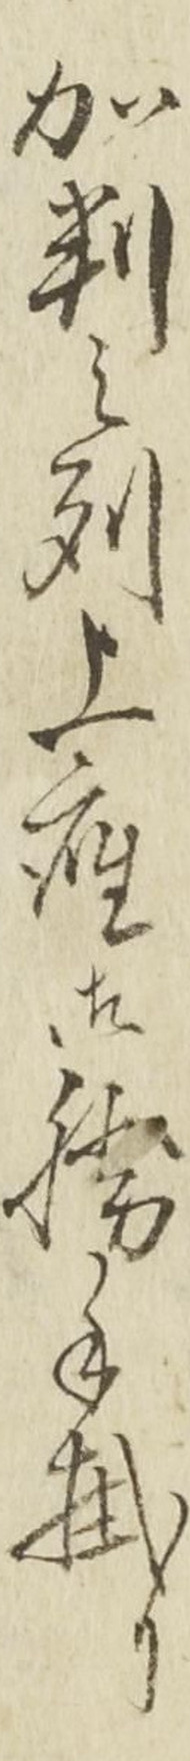加判之列上座御勝手掛り
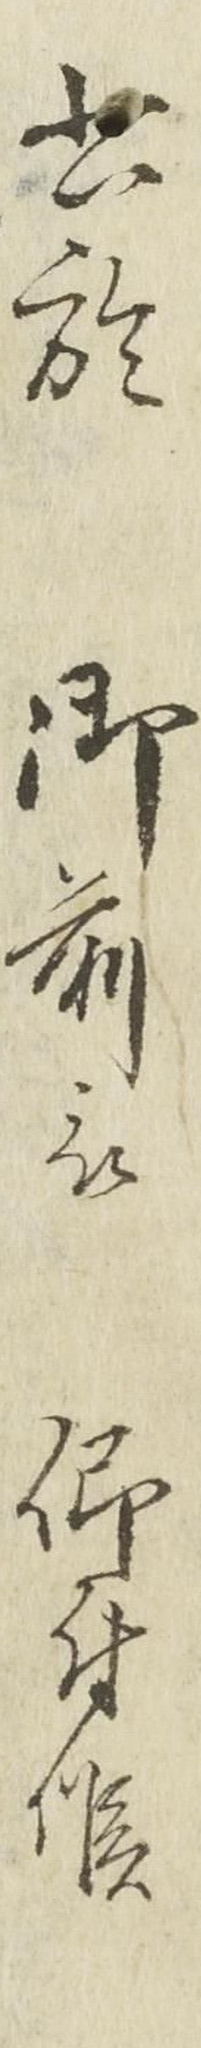右於御前被仰付候
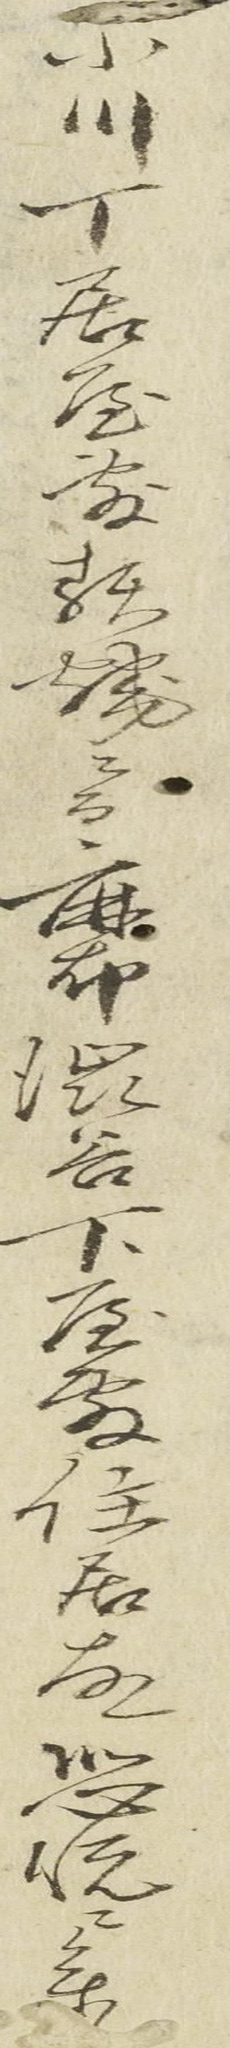小川丁居屋敷類焼ニ而麻布渋谷下屋敷住居故恐悦ニ参候
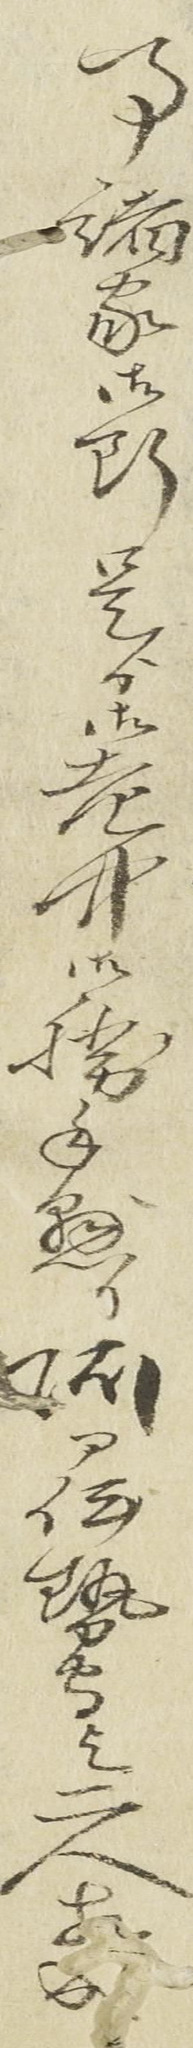事諸家御断是ゟ御老中御勝手懸り阿部伊勢守人と二人相成
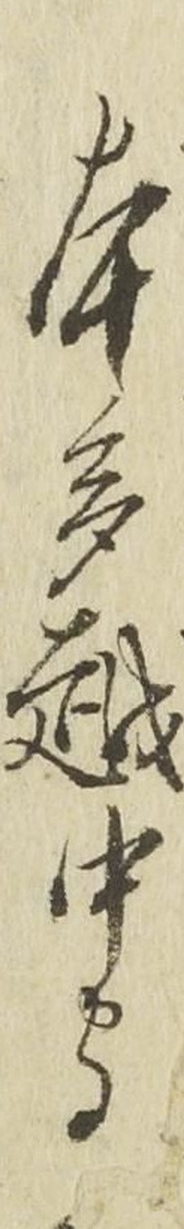本多越中守
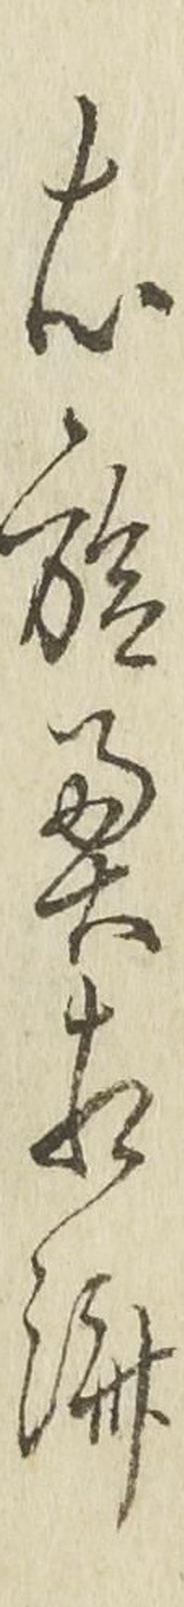右於奥相済
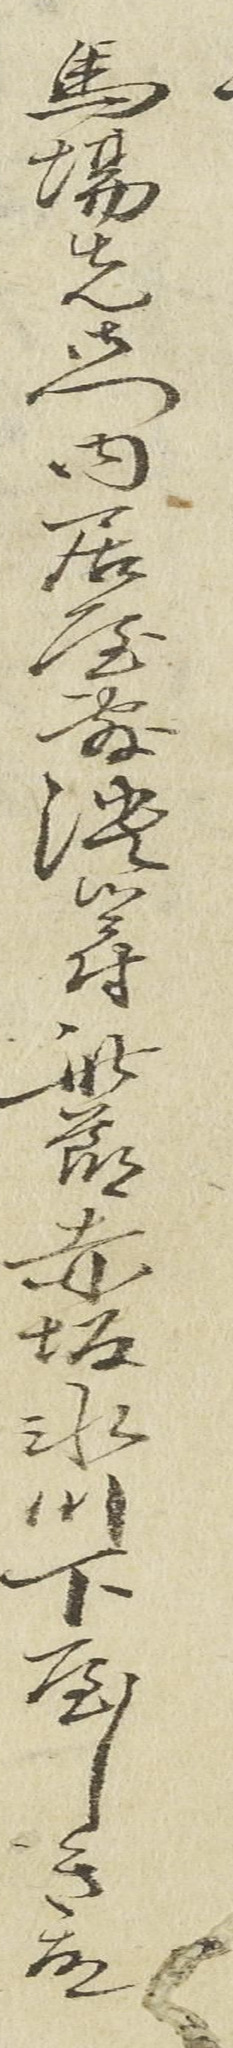馬場先御門内居屋敷潰候ニ付此節赤坂氷川下屋しき故
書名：安政二乙卯年十月二日大地震之事
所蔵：東京大学地震研究所図書室 Earthquake Research Institute Library, The University of Tokyo, JAPAN
